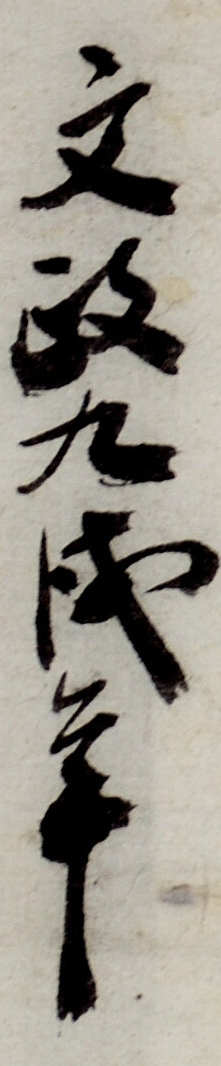文政九戌年
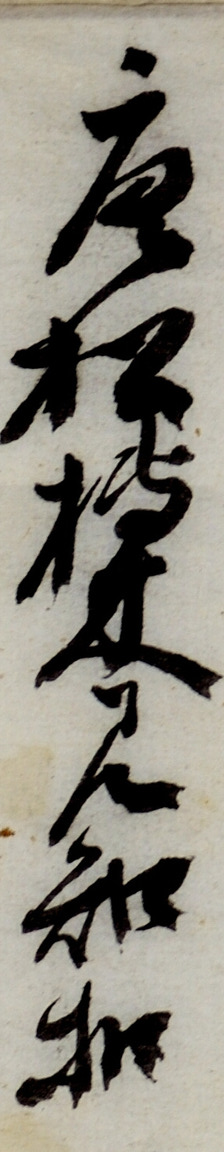唐松榑木見知扣
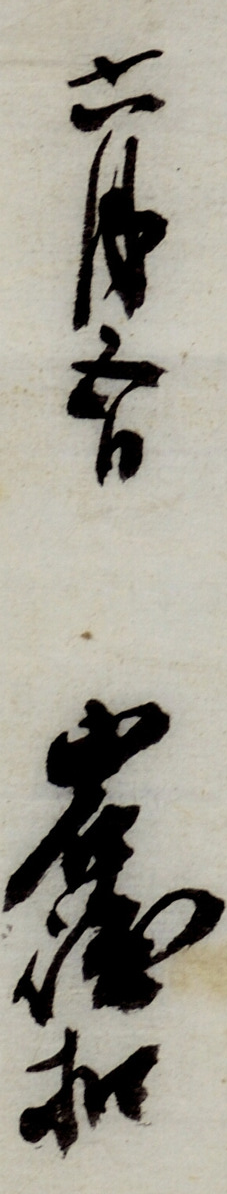六月五日岩崎扣
